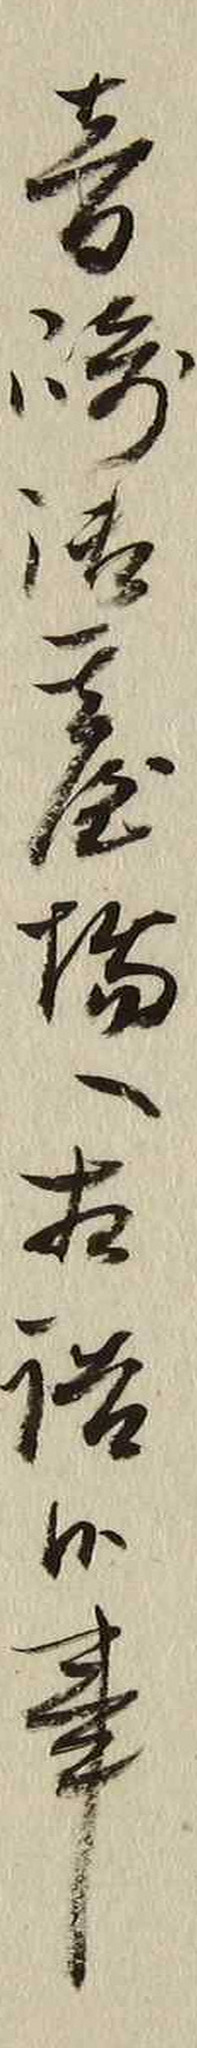音崎御台場相詰候事
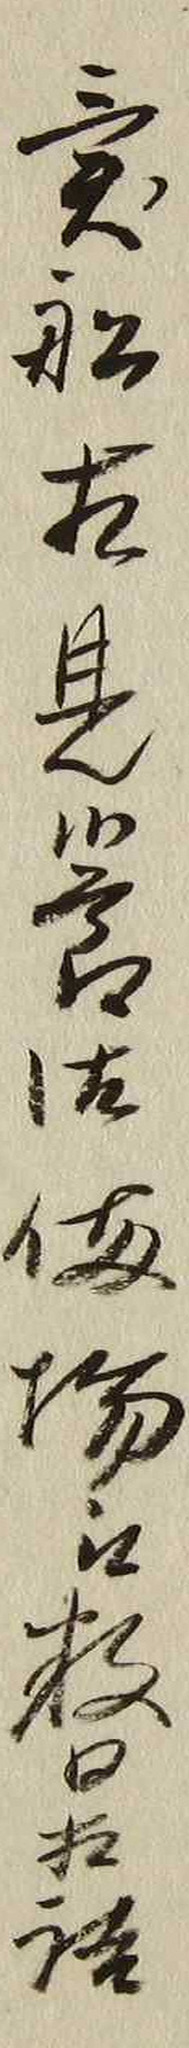異船相見候節御備場江数日相詰
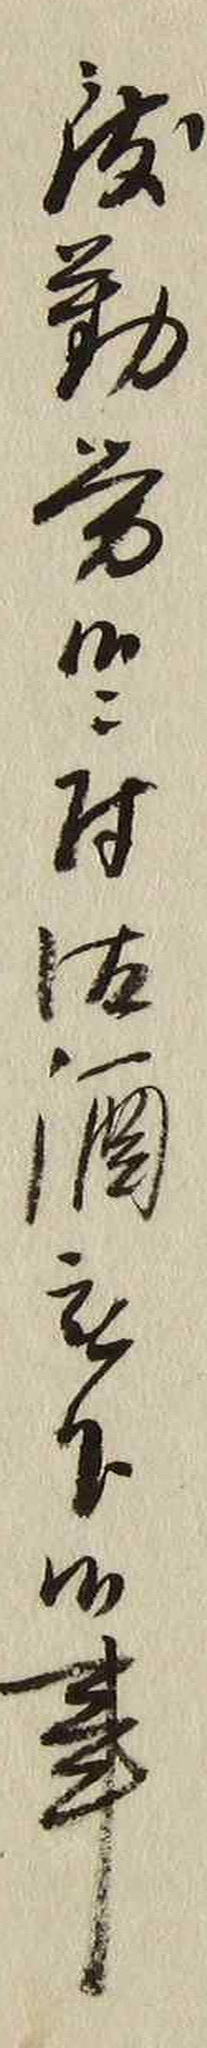致勤労候付御酒被下候事
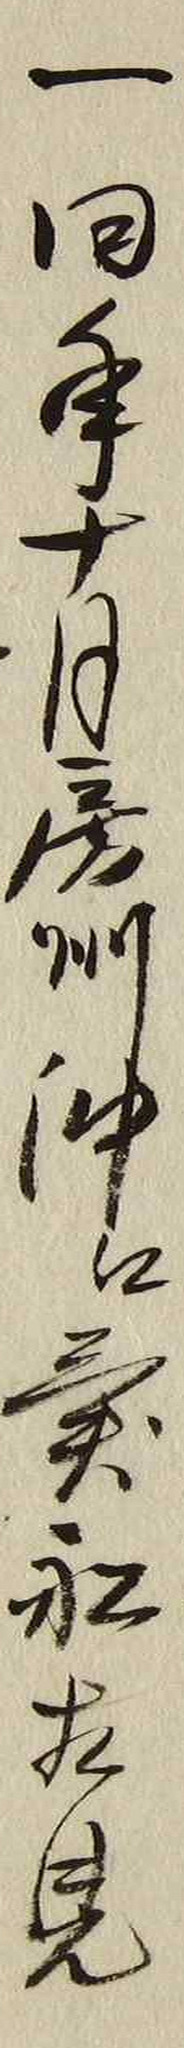一同年十月房州沖江異船相見
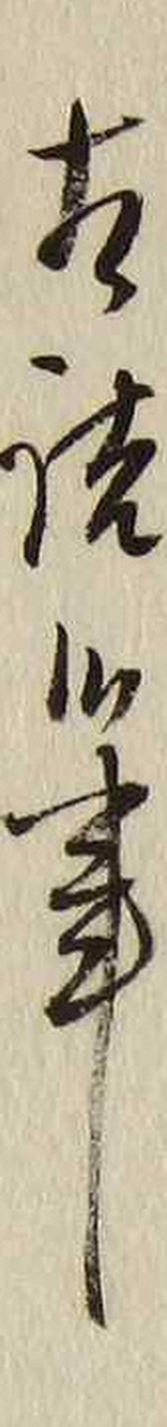相詰候事
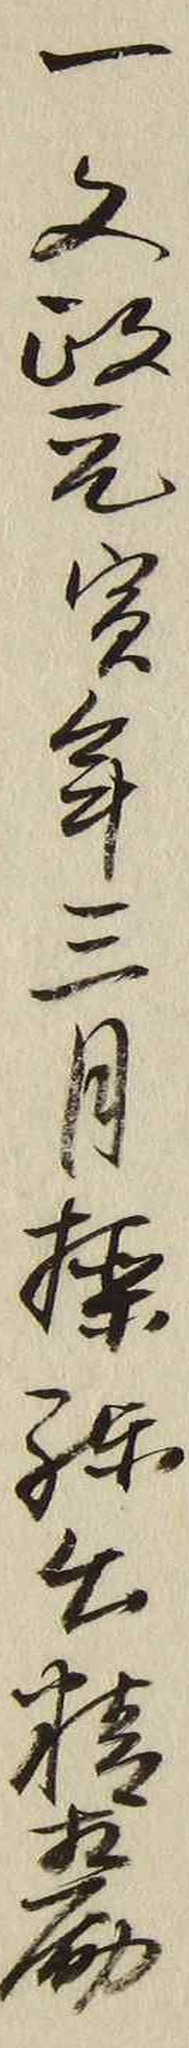一文政元寅年三月操練出精相励

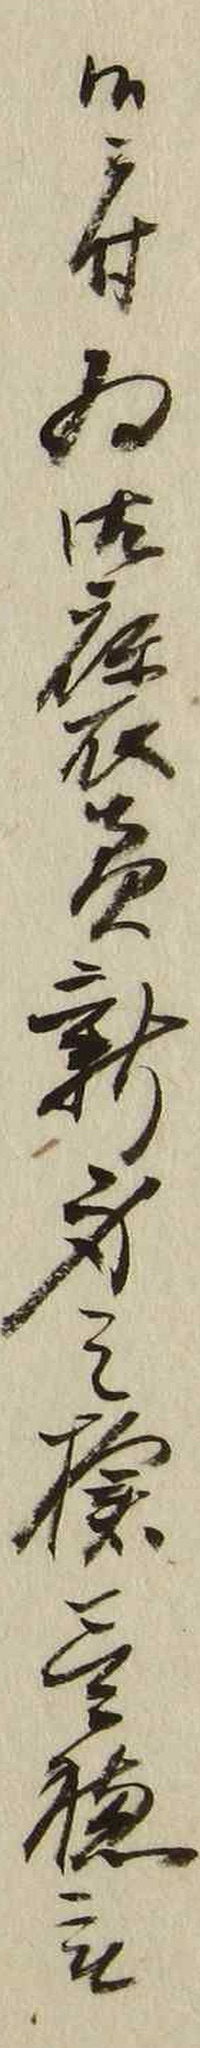候付為御褒美新身之槍壱穂被
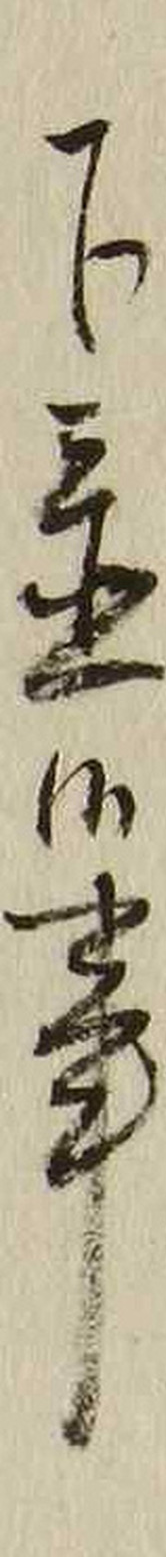下置候事
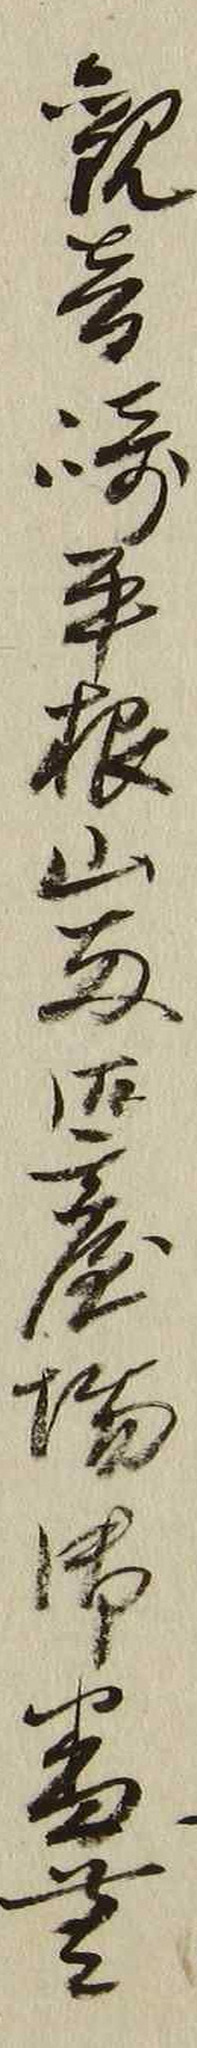観音崎平根山両御台場御番無
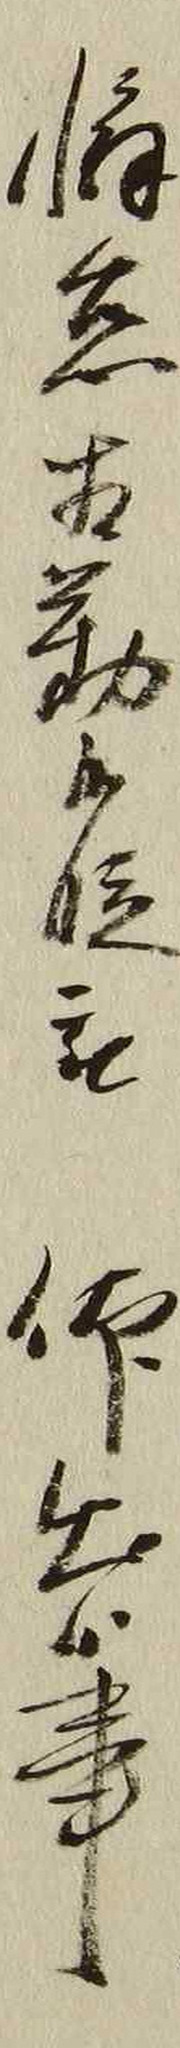懈怠相勤候段被仰出候事
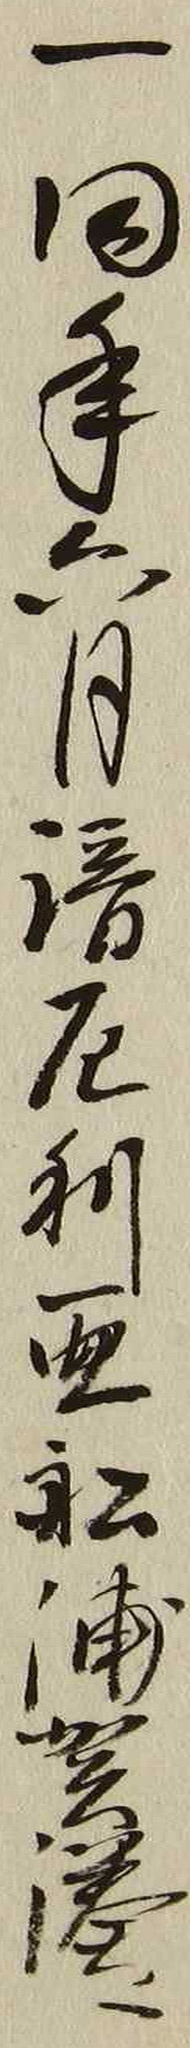一同年六月諳厄利亜船浦賀湊
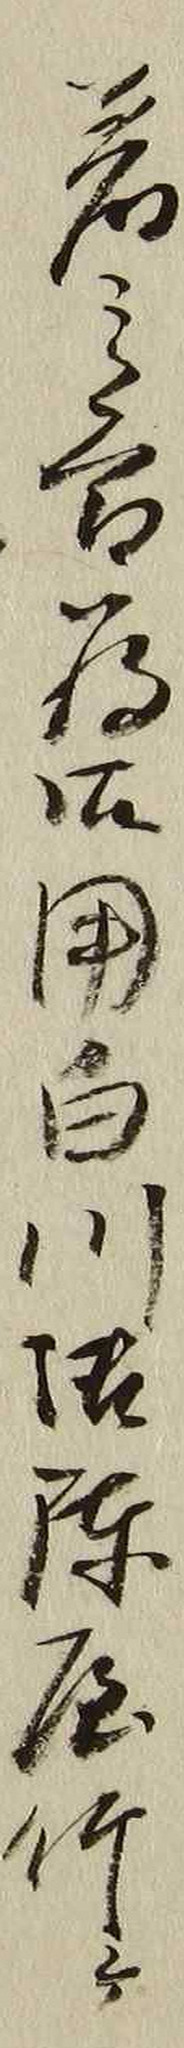着之旨為御用白川御陣屋竹
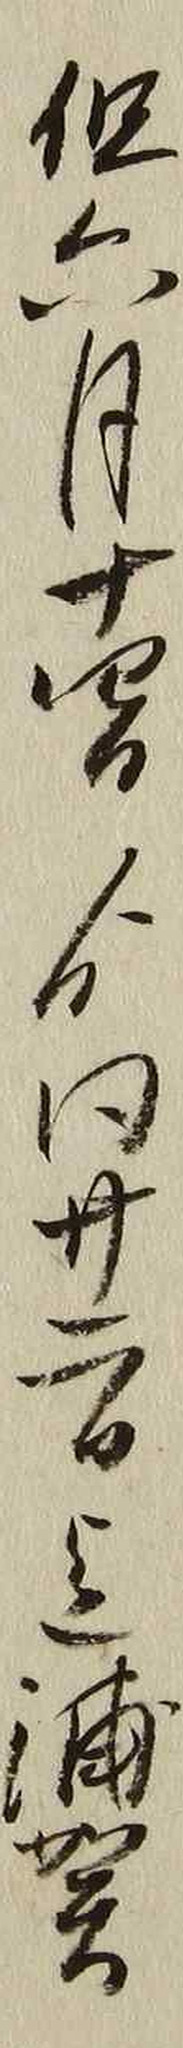但六月十四日ゟ同廿二日迄浦賀
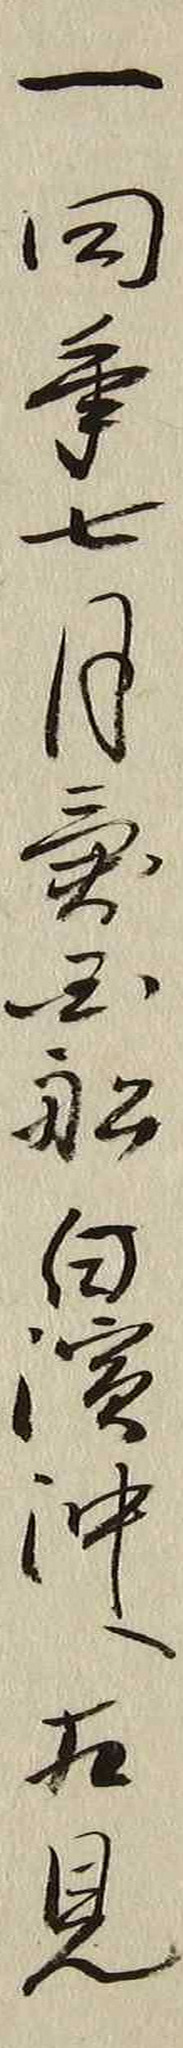一同年七月異国船白浜沖相見
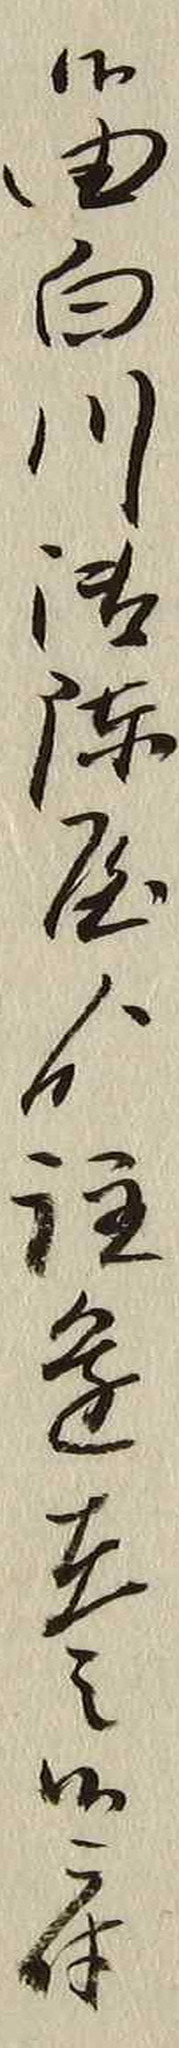候由白川御陣屋ゟ註進在之候付
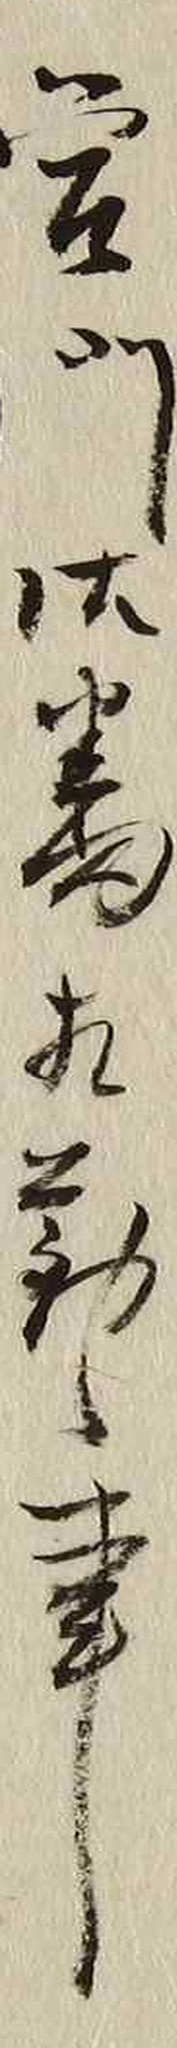営門御番相勤候事
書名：諸士系譜　巻之350　せ之部1冊全
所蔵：会津若松市立会津図書館
